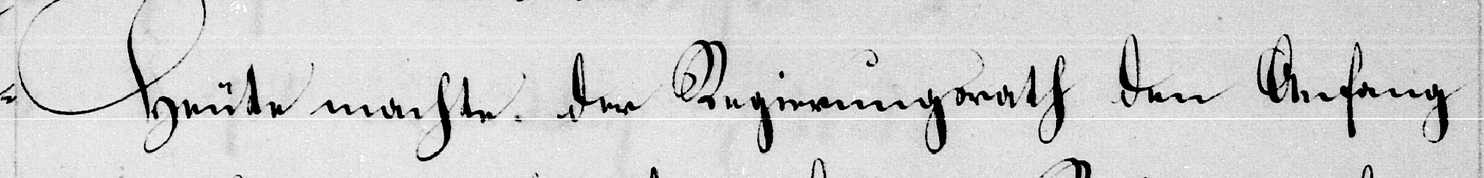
Heute machte der Regierungsrath den Anfang
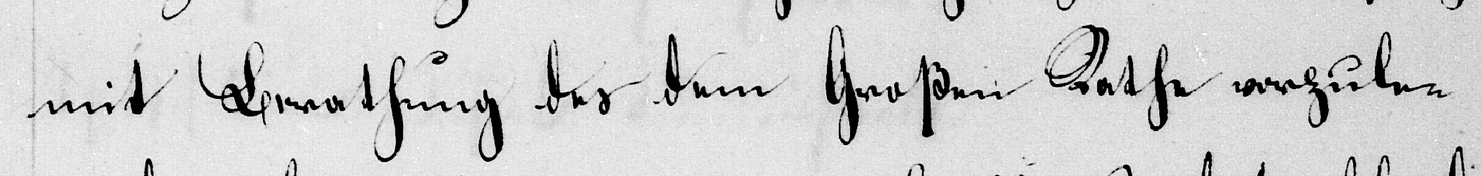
mit Berathung des dem Großen Rathe vorzule¬
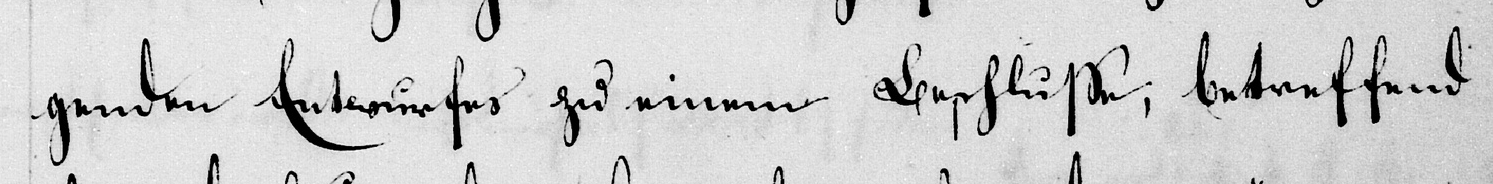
genden Entwurfes zu einem Beschluße, betreffend
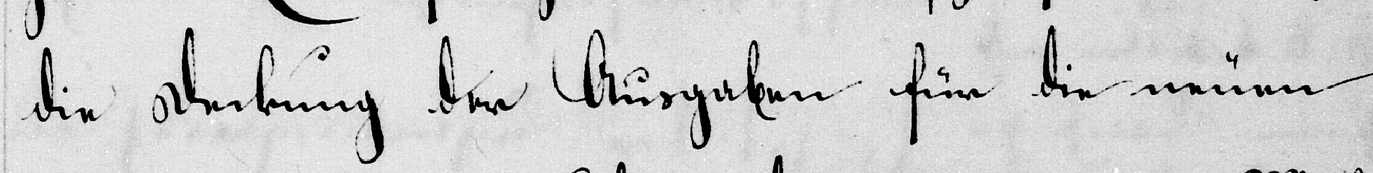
die Deckung der Ausgaben für die neuen
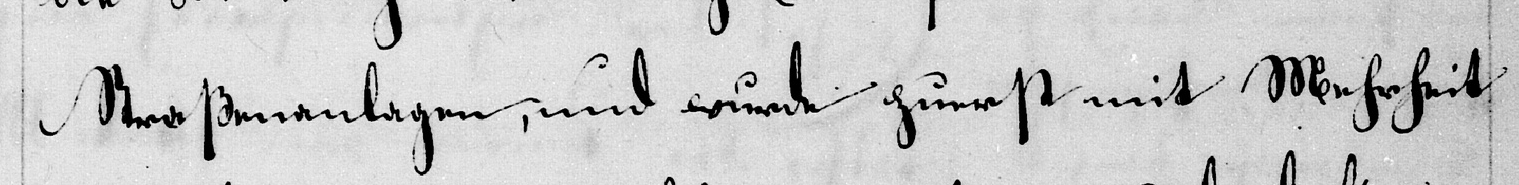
Straßenanlagen, und wurde zuerst mit Mehrheit
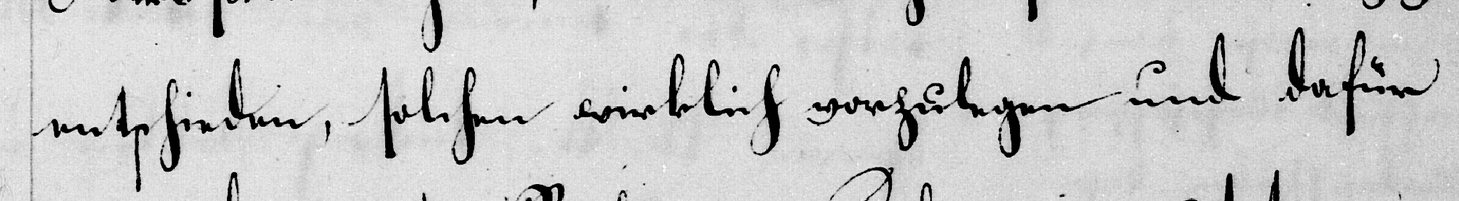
entschieden, solchen wirklich vorzulegen und dafür
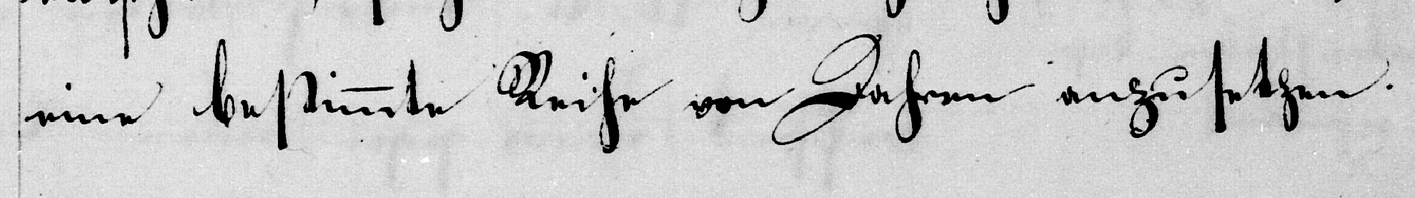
eine bestimmte Reihe von Jahren anzusetzen.
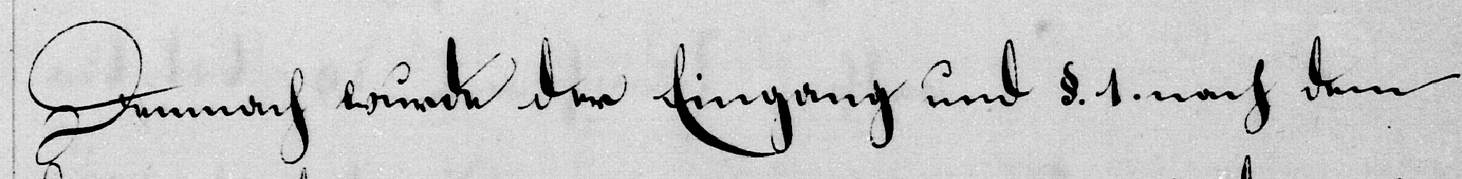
Demnach wurde der Eingang und §. 1. nach dem
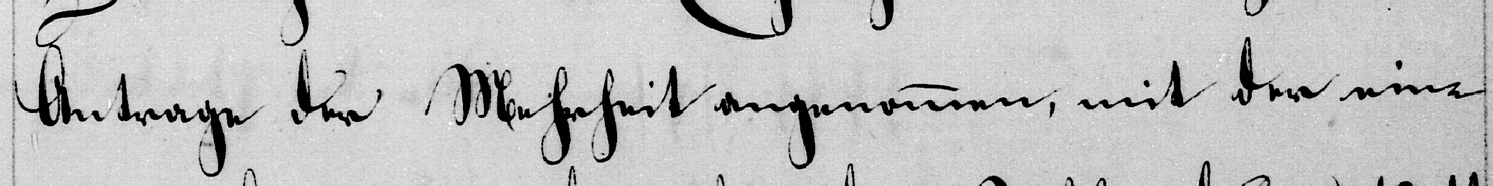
Antrage der Mehrheit angenommen, mit der ein¬
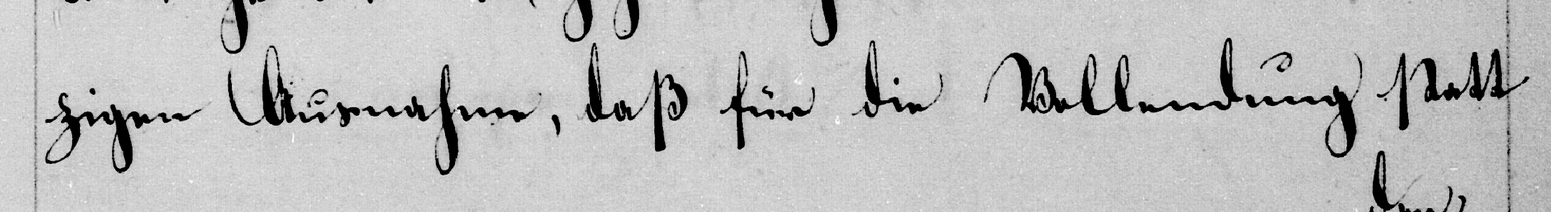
zigen Ausnahme, daß für die Vollendung statt
